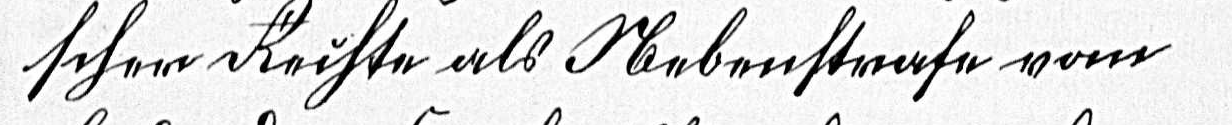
scher Rechte als Nebenstrafe vom
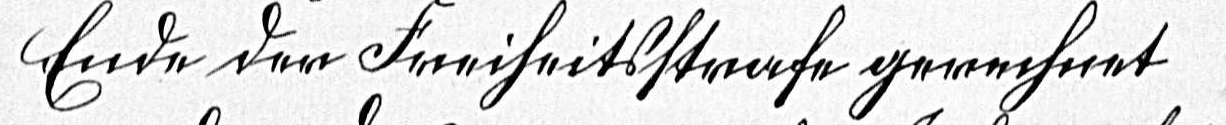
Ende der Freiheitsstrafe gerechnet
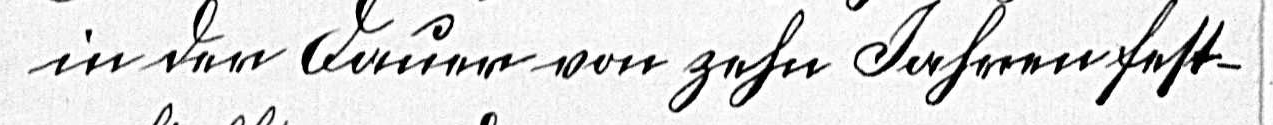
in der Dauer von zehn Jahren fest¬
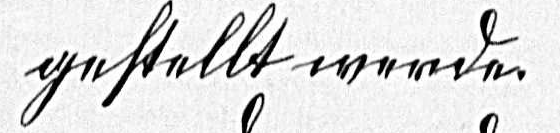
gestellt werde.
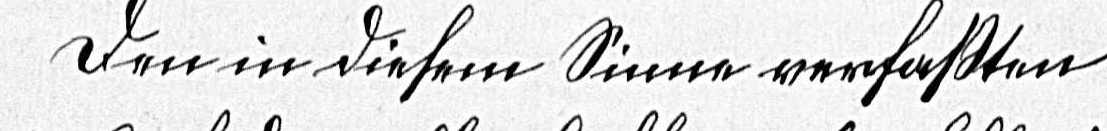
Den in diesem Sinne verfaßten
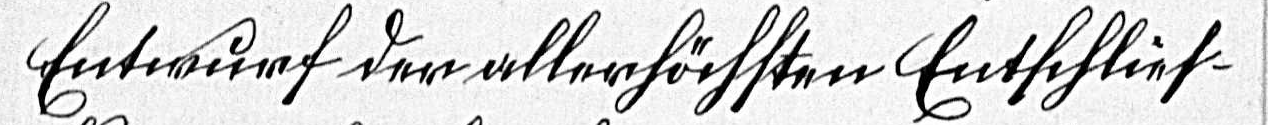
Entwurf der allerhöchsten Entschlies¬
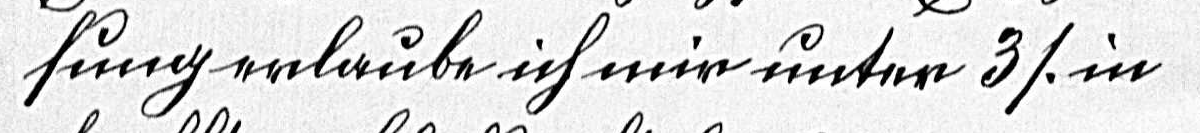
sung erlaube ich mir unter 3 s. in
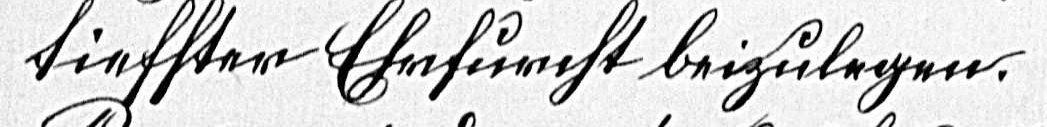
tieffter Ehrfurcht beizulegen.
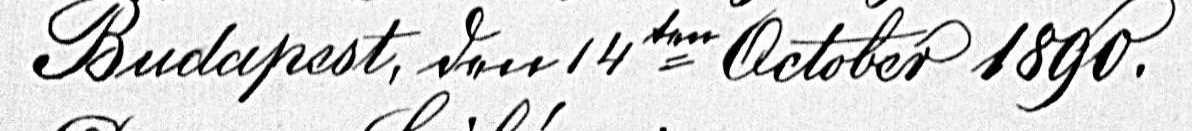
Budapest, den 14ten October 1890.
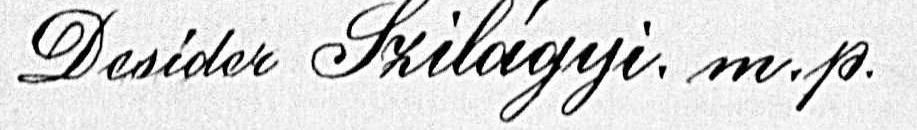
Desider Szilágyi. m.p.
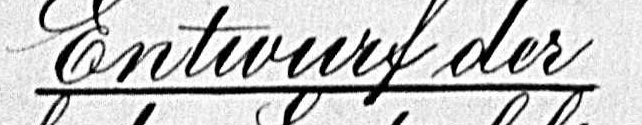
Entwurf der
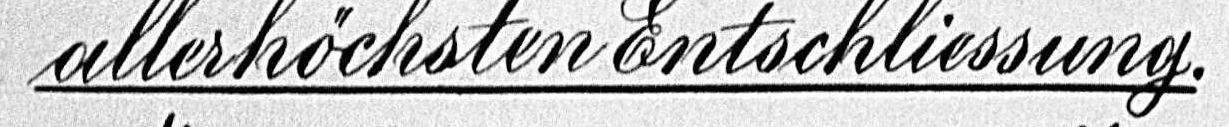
allerhöchsten Entschliessung.
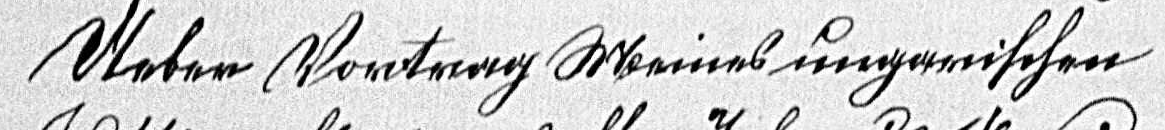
Unter Vortrag Meines ungarischen
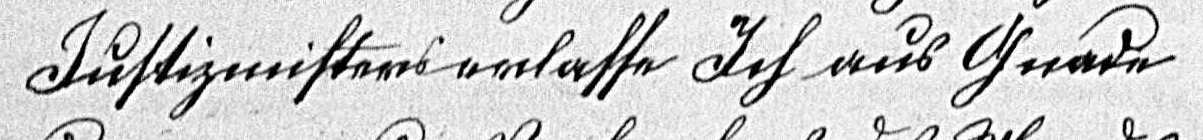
Justizmisters erlasse Jch aus Gnade
